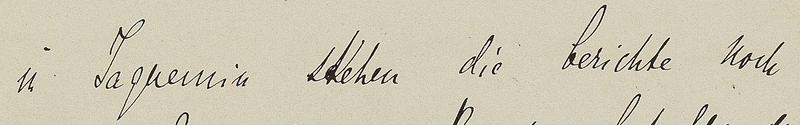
u Jaquemin stehen die Berichte noch
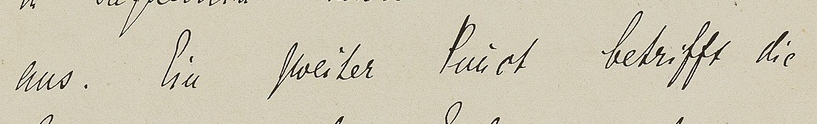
aus. Ein zweiter Punct betrifft die
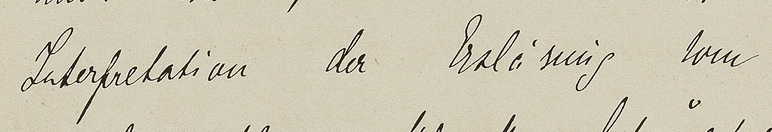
Interpretation der Erklärung vom
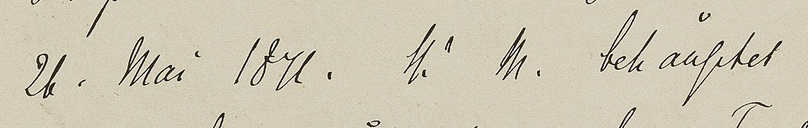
26. Mai 1871. HrM. behauptet
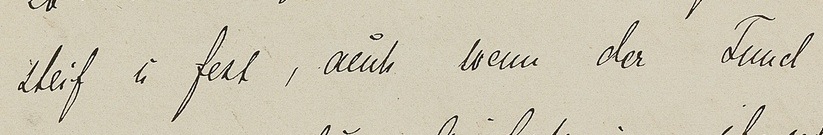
steif u fest, auch wenn der Tunel
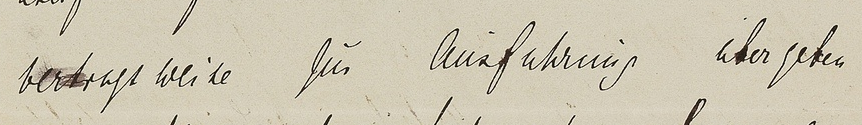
vertragsweise zur Ausführung übergeben
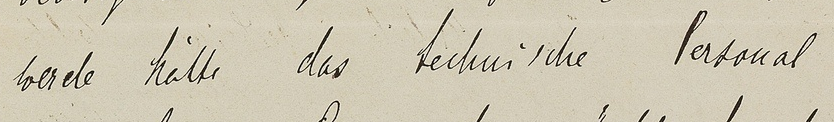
werde hätte das technische Personal
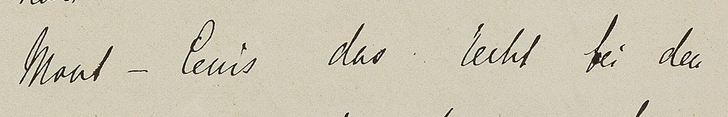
Mont-Cenis das Recht bei den
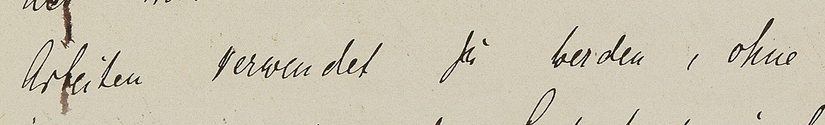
Arbeiten verwendet zu werden, ohne
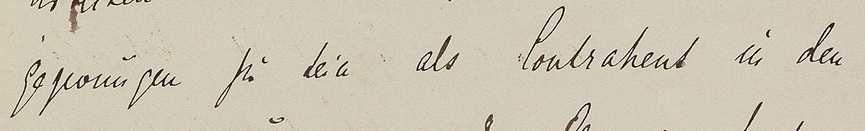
gezwungen zu sein als Contrahent in den
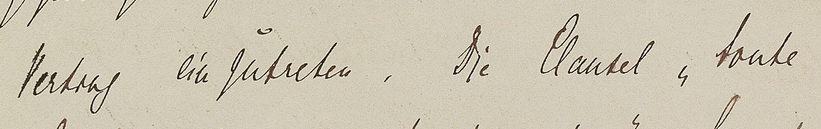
Vertrag einzutreten. Die Clausel «toute
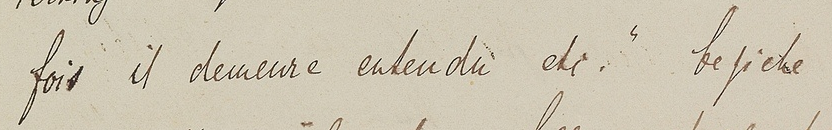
fois il demeure entendu etc.» beziehe
